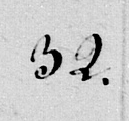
32.
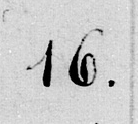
16.
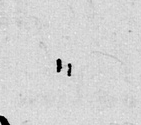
den
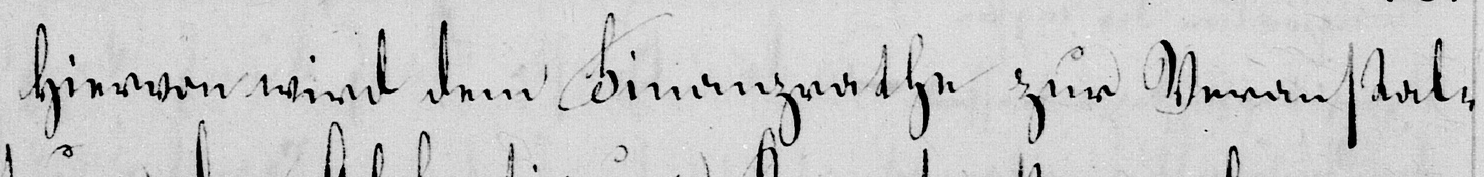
Hiervon wird dem Finanzrathe zur Veranstal¬
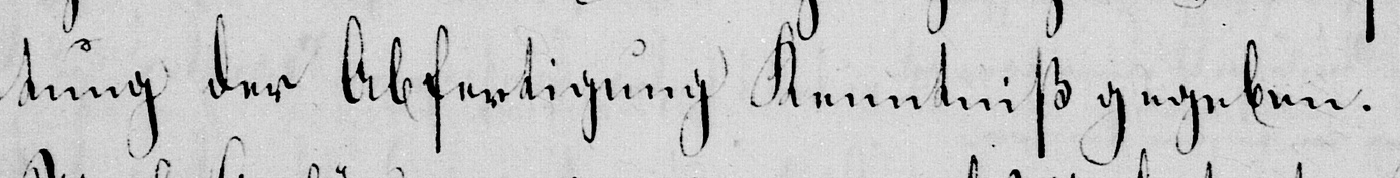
tung der Abfertigung Kenntniß gegegen.
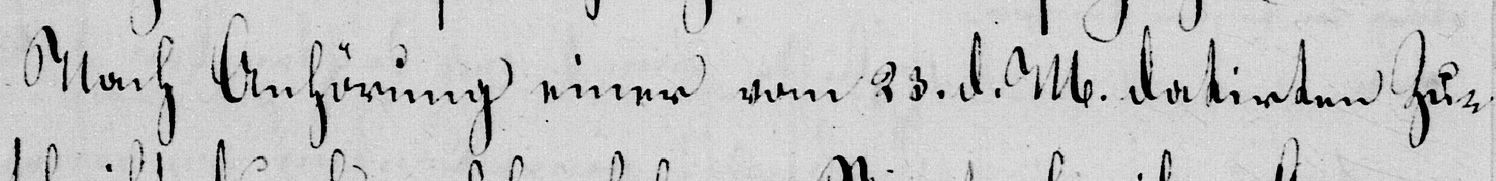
Nach Anhörung einer vom 23. d. M. datirten Zu¬
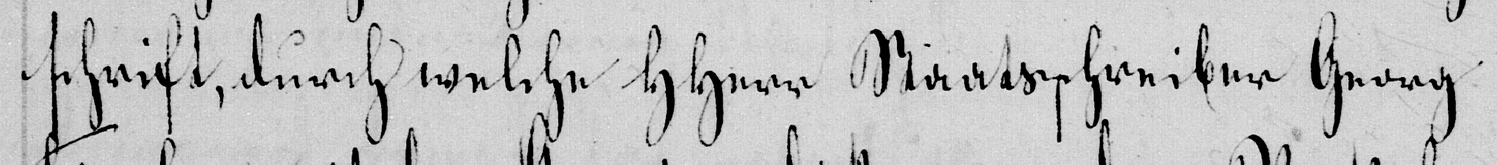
schrift, durch welche HHerr Staatsschreiber Georg
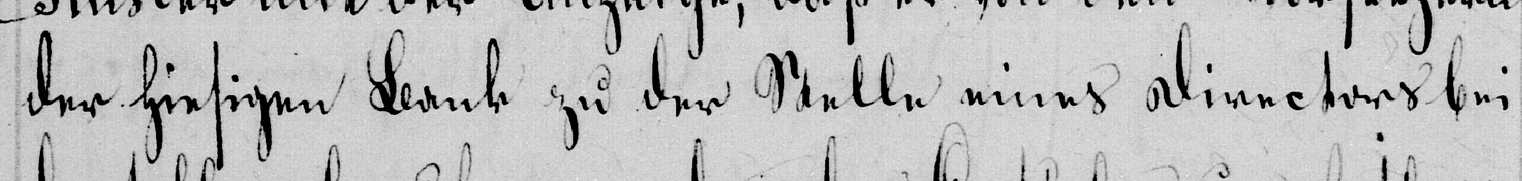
der hiesigen Bank zu der Stelle eines Directors bei
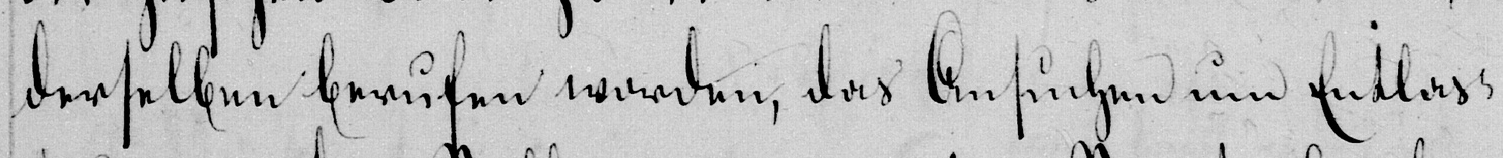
derselben berufen worden, das Ansuchen um Entla¬
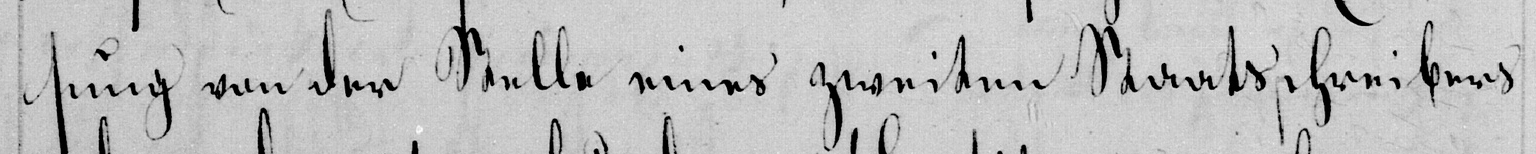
ßung von der Stelle eines zweiten Staatsschreibers
